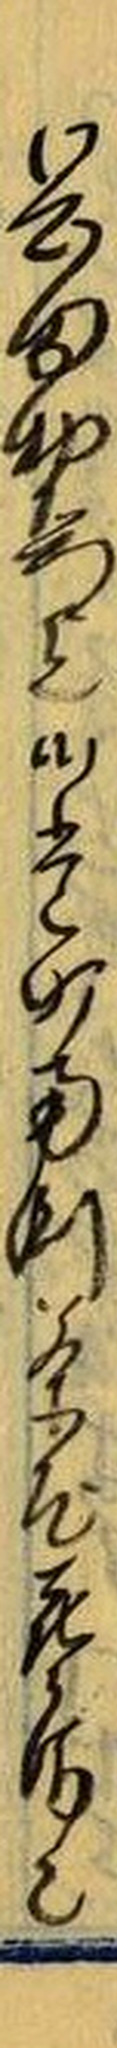岡田助右衛門迄御堂町南側茶屋出店迄
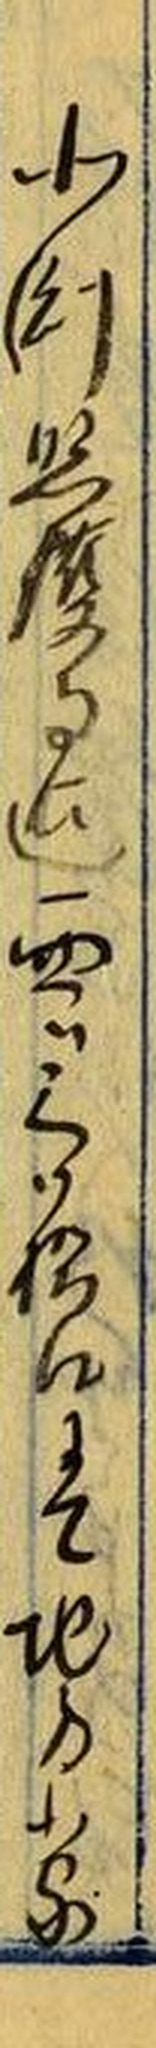北川照慶寺迄西ハ三ッ橋口にて地方小家
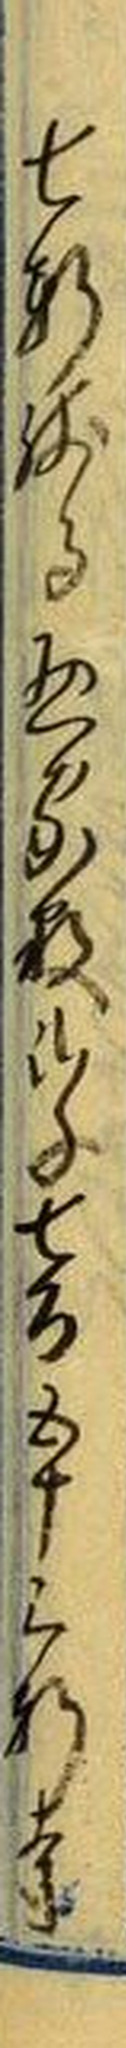七軒残る惣家数弐千七百五十三軒寺
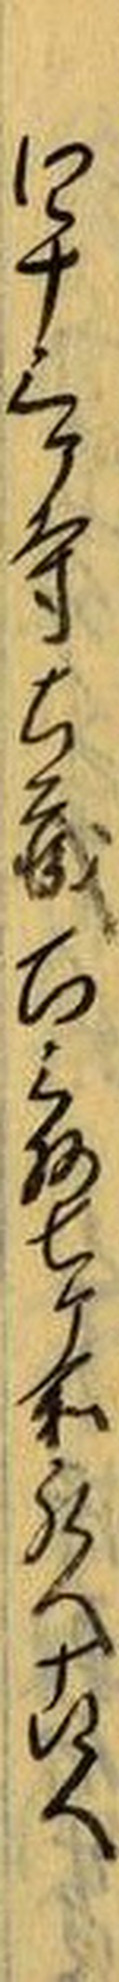四十三ヶ寺土蔵百三拾七ヶ所死人十四人
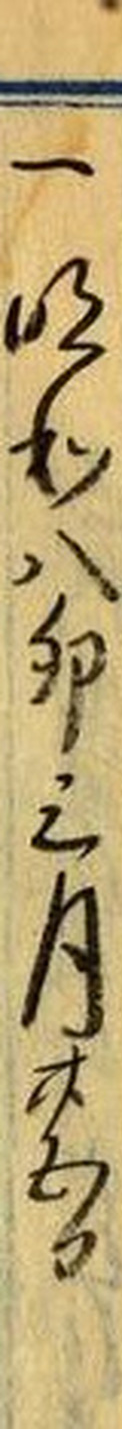一明和八卯三月廿五日
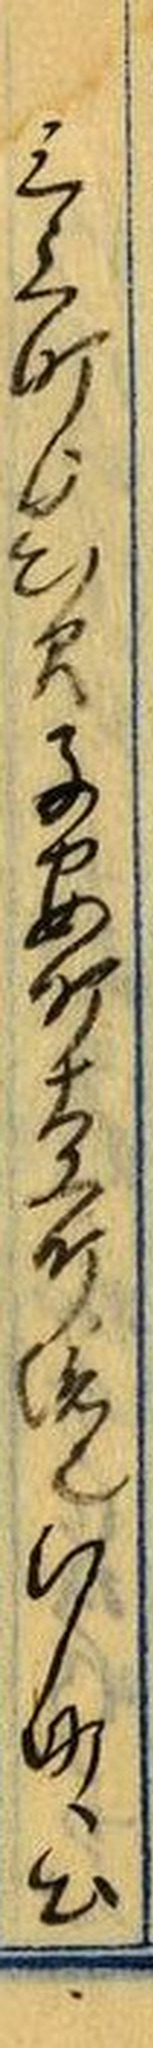三上町ゟ出火子安町大工町焼ㇽ町へ出
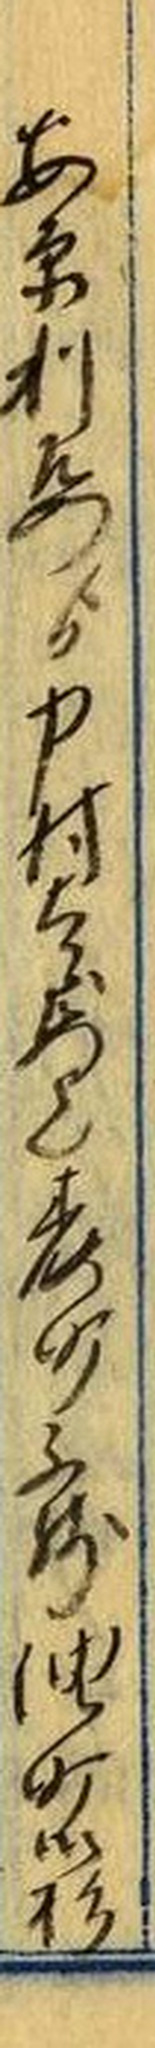安原利右衛門ゟ中村太郎右衛門迄表町不残油町御杉
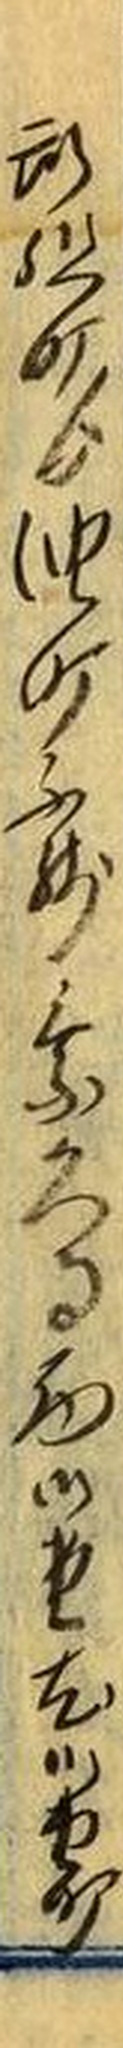形組町ゟ油町不残乗久寺西御堂尤小堂町
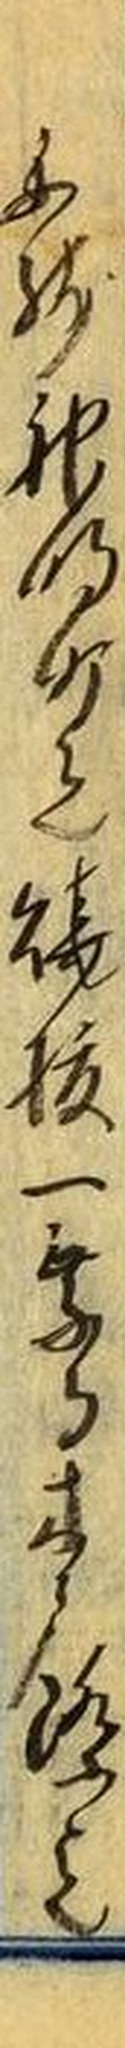不残神明町迄焼抜一乗寺木戸際迄
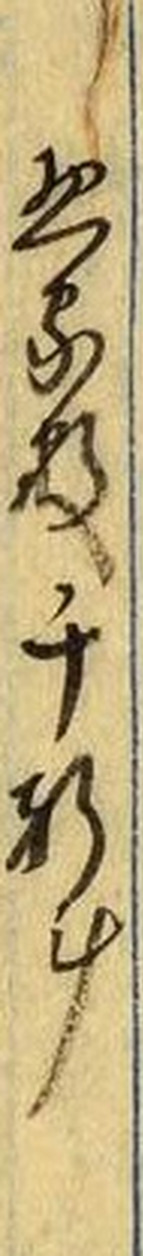惣家数千軒斗

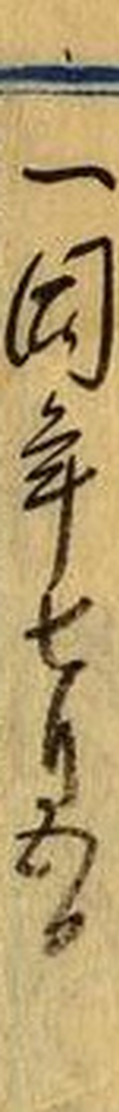一同年七月五日
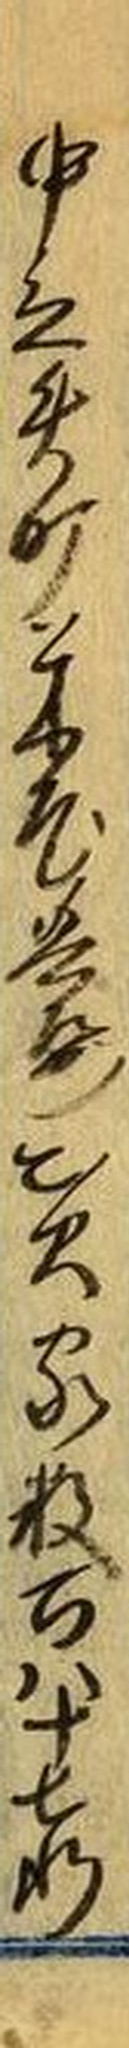中立矢町米屋兵左衛門出火家数百八十七軒
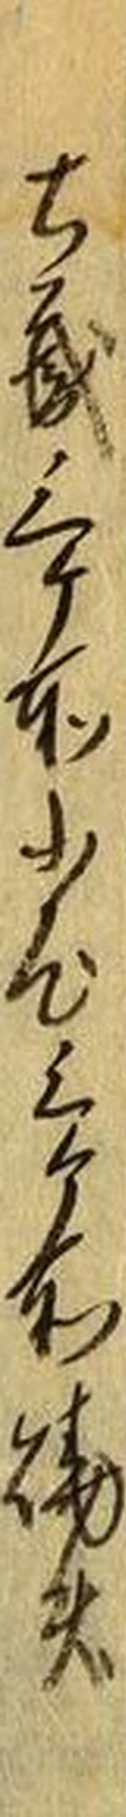土蔵三ヶ所小屋三ヶ所焼失
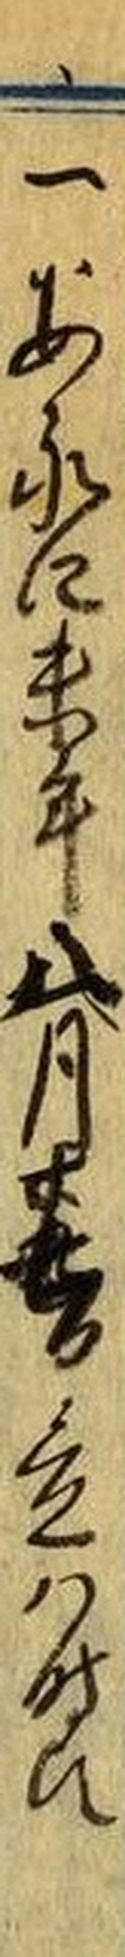一安永四未年八月廿七日昼八時頃
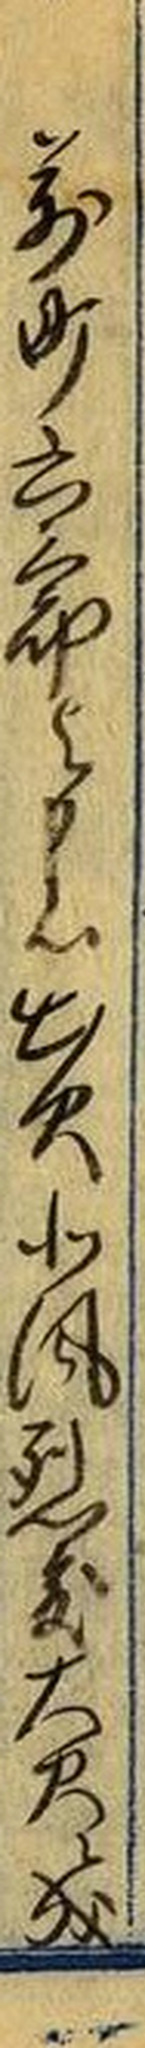万町六三郎と申者出火北風烈敷大火に成
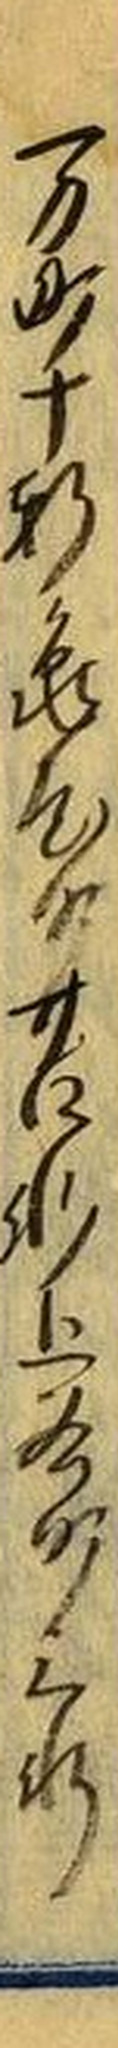万町十軒亀屋町廿四軒上谷町三軒
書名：温古集 五巻
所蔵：福井県文書館 Fukui Prefectural Archives
